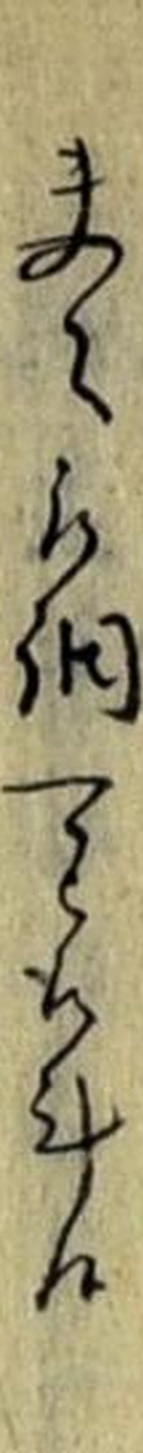夫々取調可被取斗候
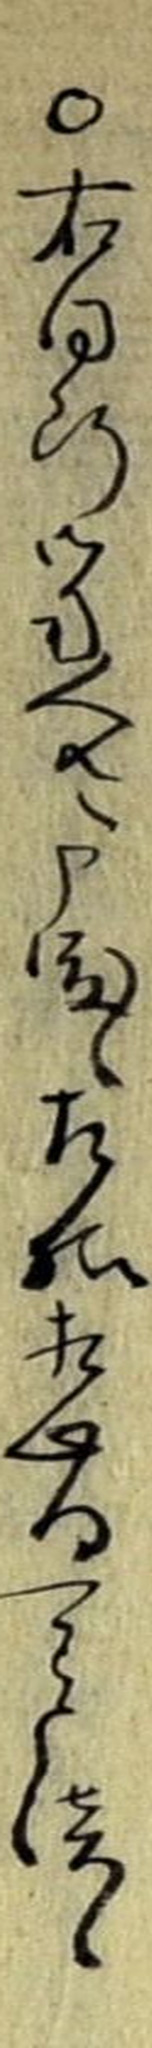○右同断御用人共へ申渡候左様相心得可被申談候
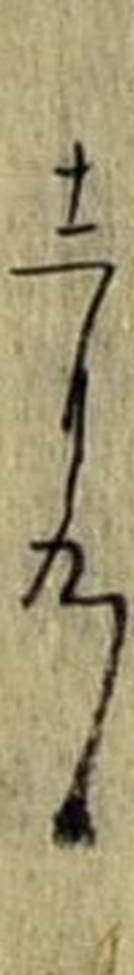十二月九日

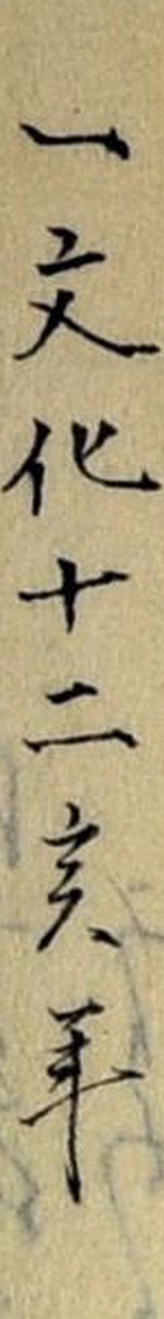一文化十二亥年
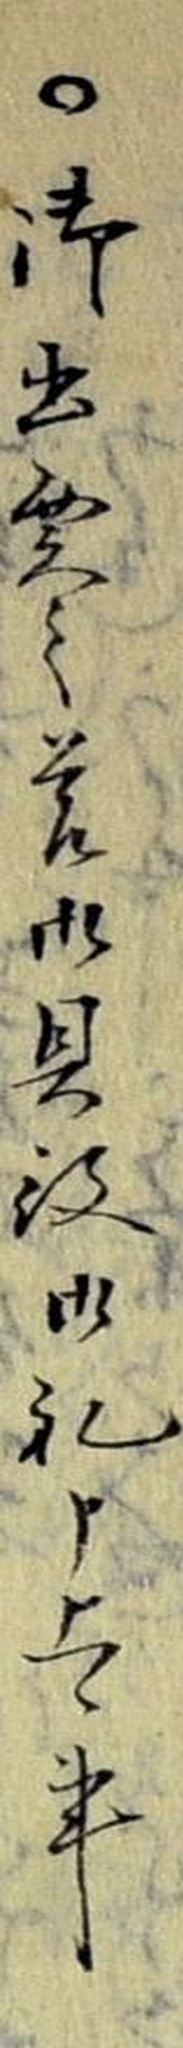○御出殿之節御具役御礼申上候事
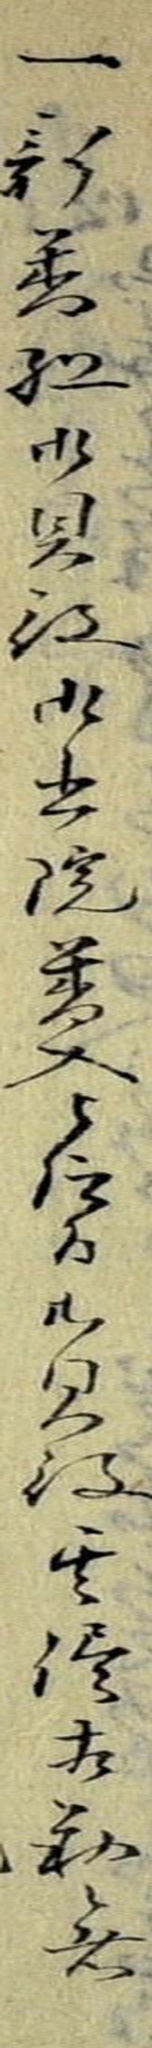一新番組御具役御書院番入被仰付御具役其侭相勤候者
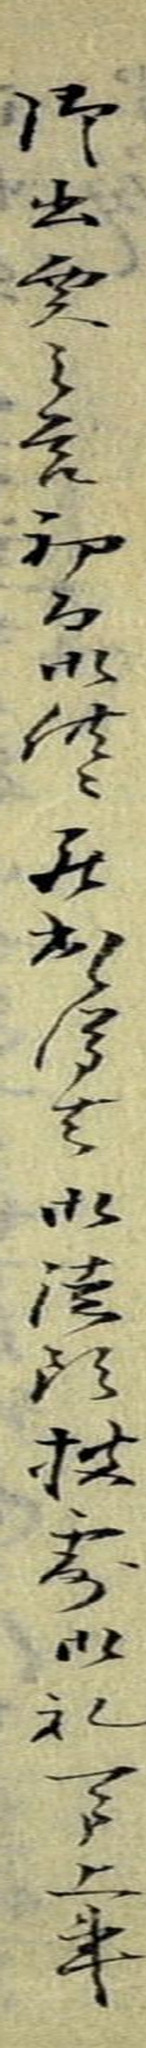御出殿之節初而御供に罷出候得は御徒頭披露御礼可申上
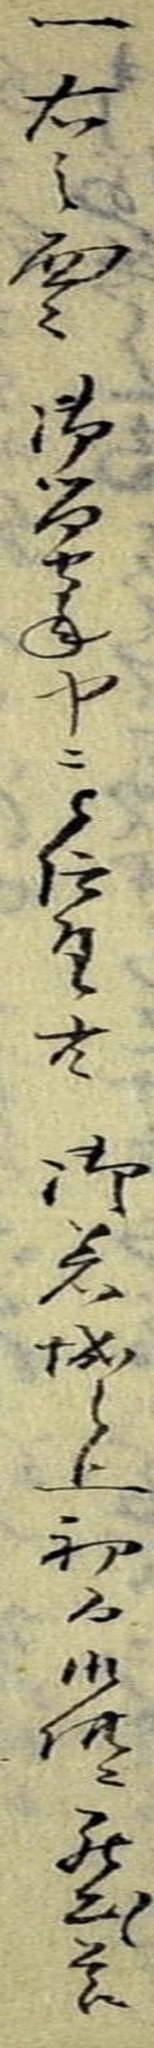一右之面々御留守年中に被仰付候共御着城之上初而御供に罷出候節
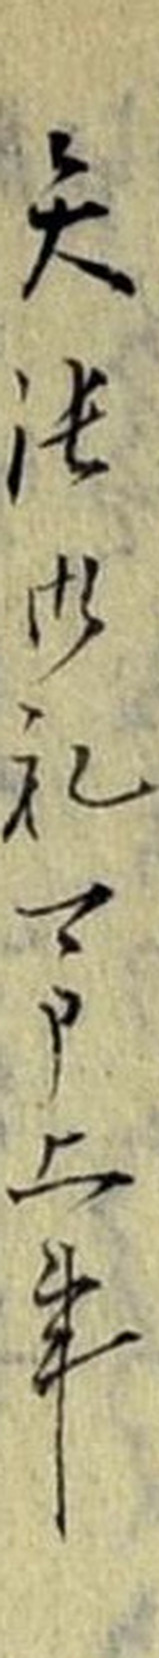矢張御礼可申上事
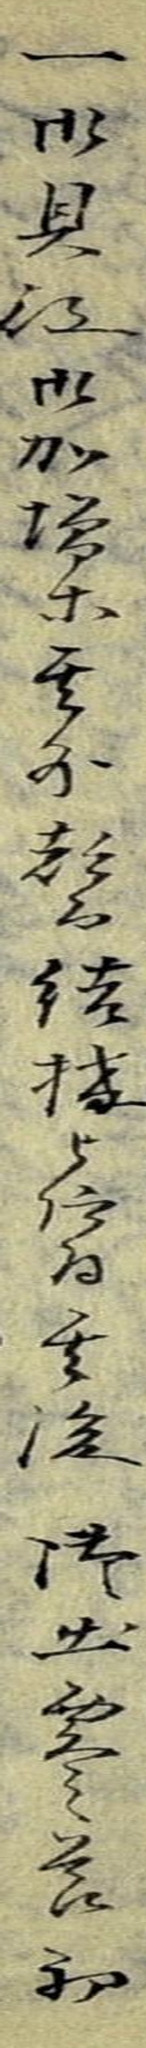一御具役御加増等其外都而結構被仰付其後御出殿之節初
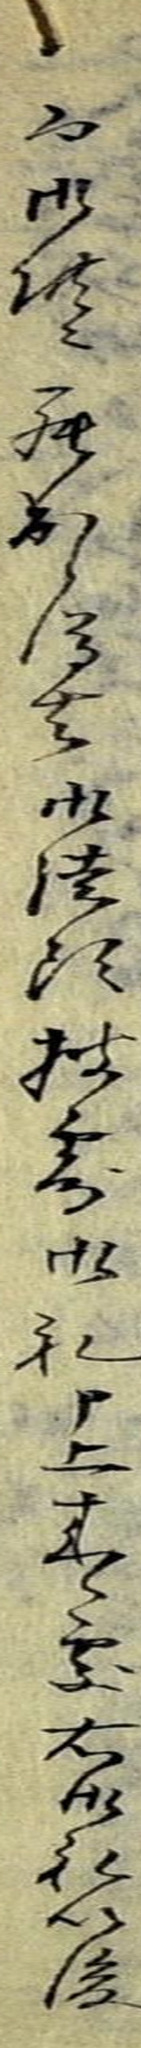而御供に罷出候得は御徒頭披露御礼申上来候処右御礼以後
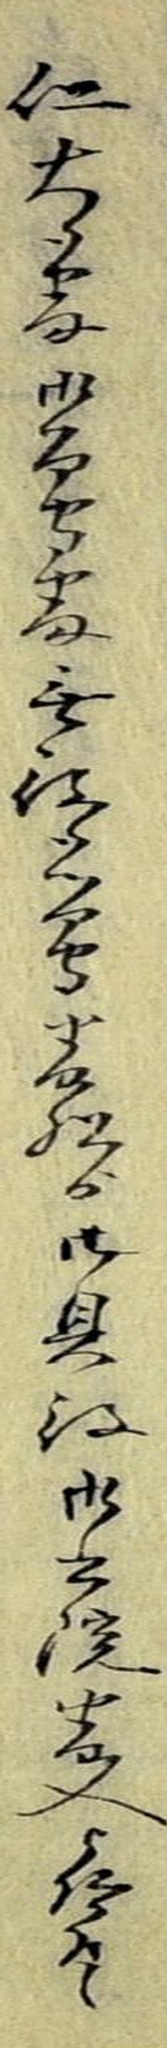但大御番御留守番無役御留守番組ゟ御具役御書院番入被仰付候
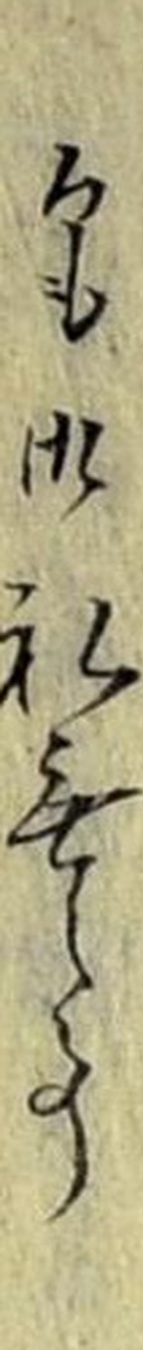而も御礼無之事
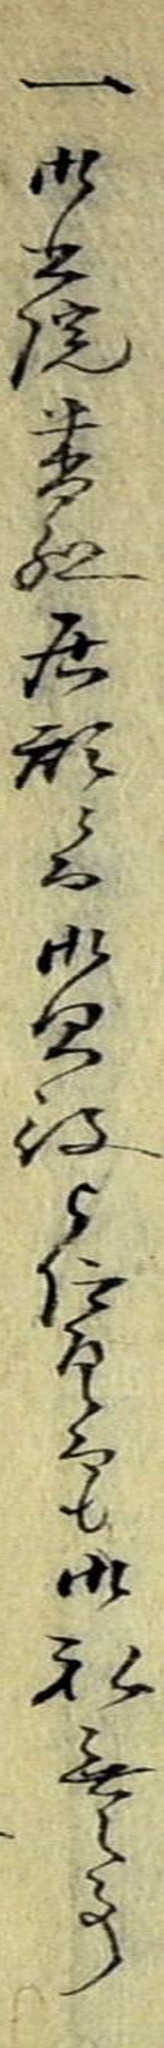一御書院番組居形に而御具役被仰付候而も御礼無之事
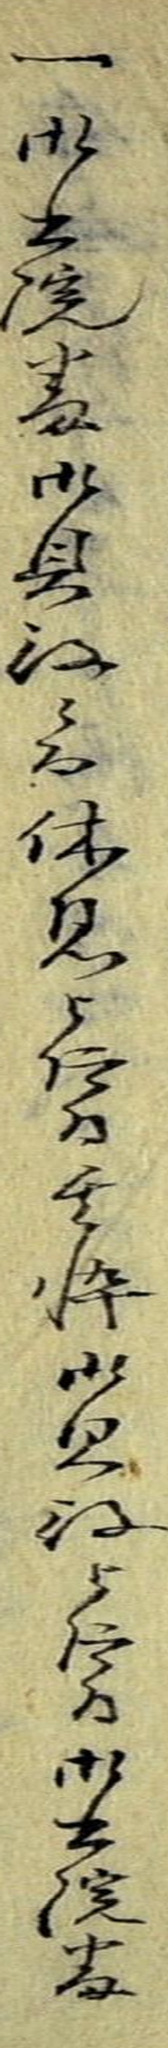一御書院番御具役に而休息被仰付其忰御具役被仰付御書院番
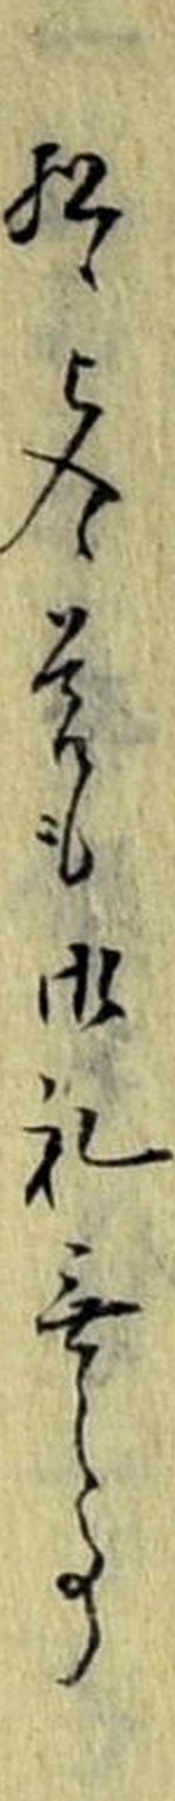組へ被入候節も御礼無之事
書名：命令之部 四
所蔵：福井県文書館 Fukui Prefectural Archives
